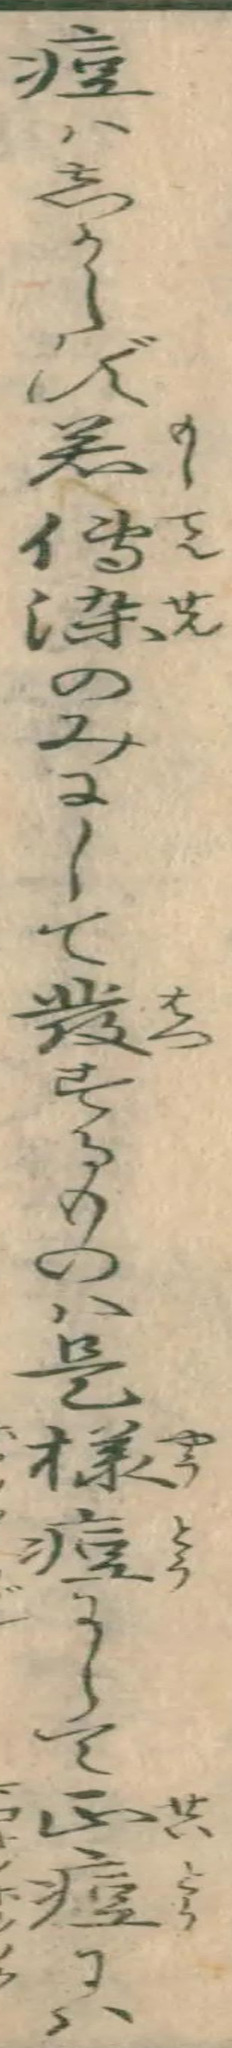痘はしかしず若傳染のみにして発するものは是様痘にして正痘には
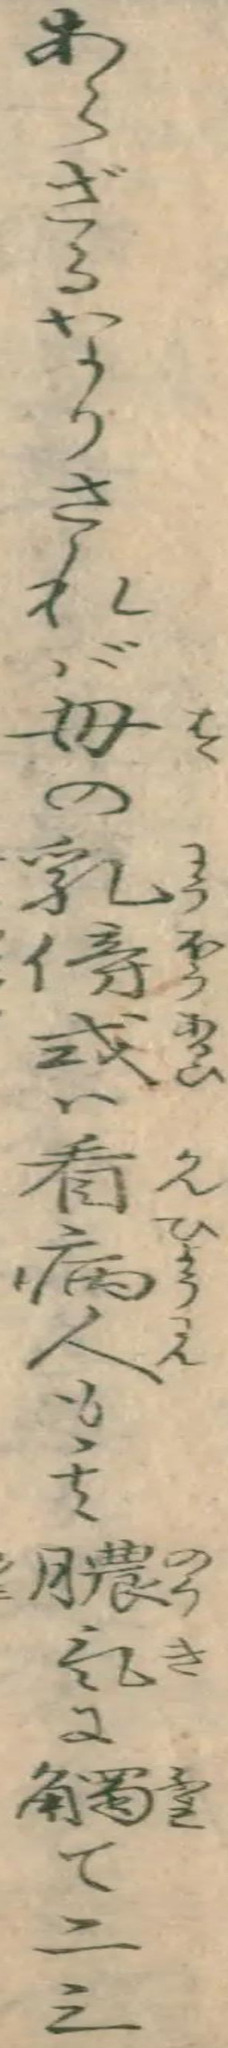あらざるなりされば母の乳傍或は看病人も其の膿気に觸て二三
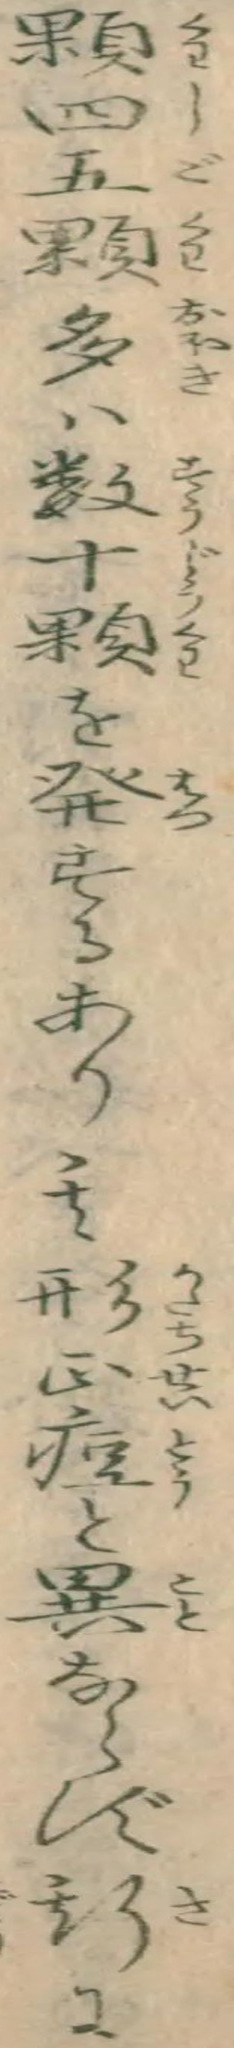顆四五顆多は数十顆を発するあり其形正痘と異ならず斯に
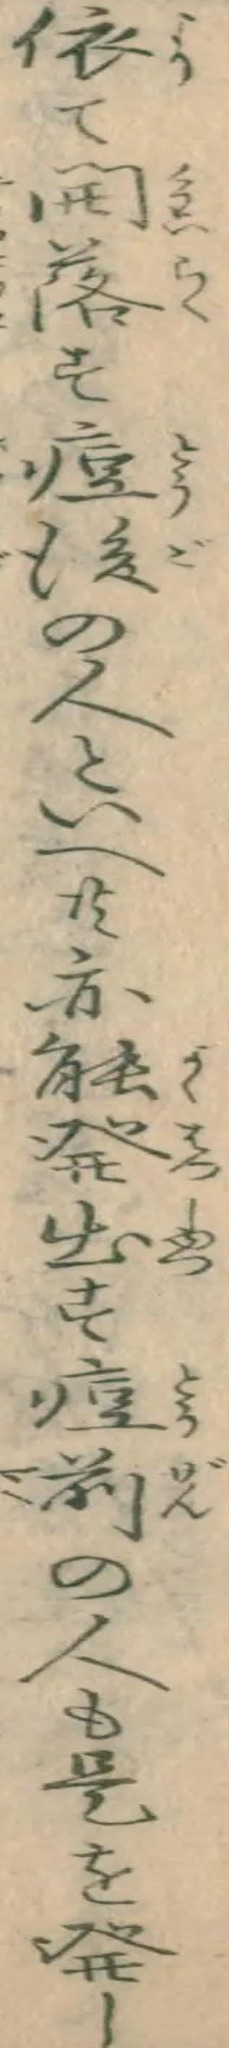依て開落す痘後の人といへ其亦触発出す痘前の人の是を発し
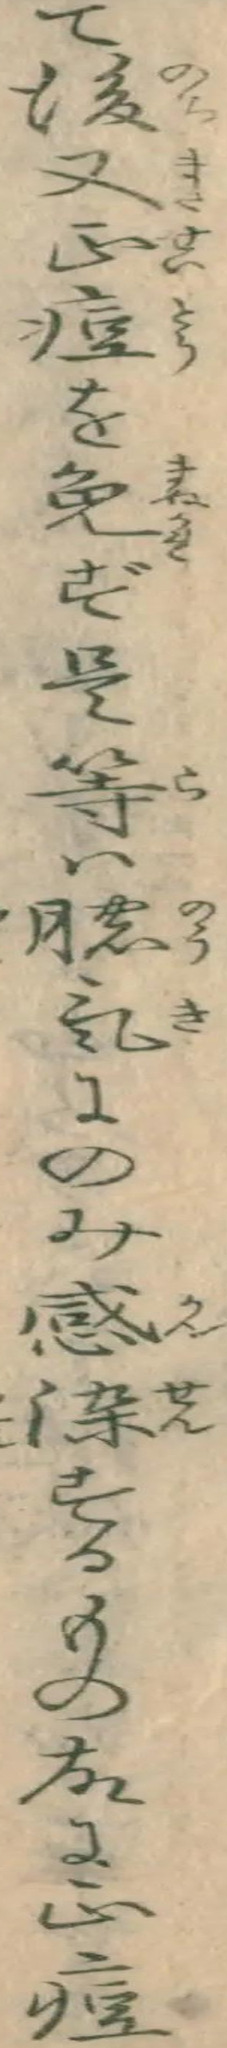て後又正痘を免ず是等は膿気にのみ感染するもの故に正痘
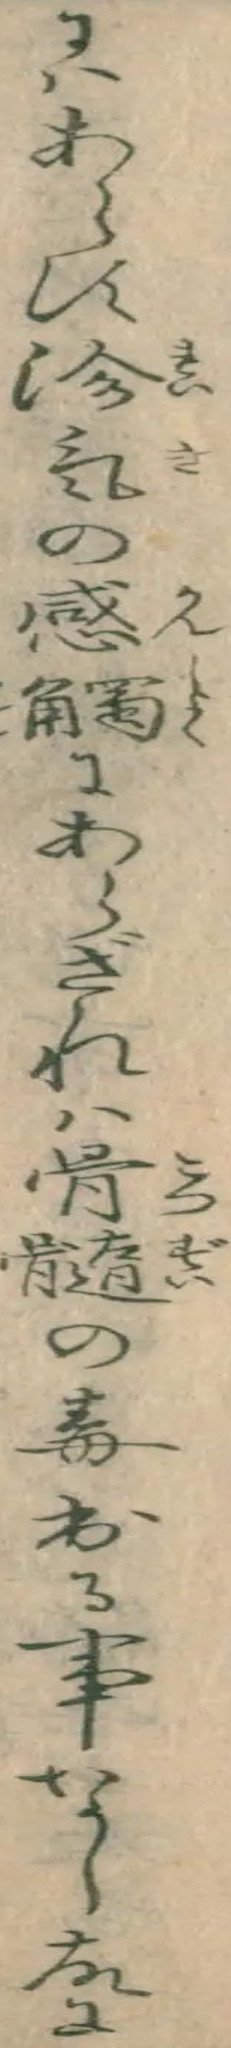にはあらす沴気の感觸にあらざれは骨髄の毒おる事なし故に

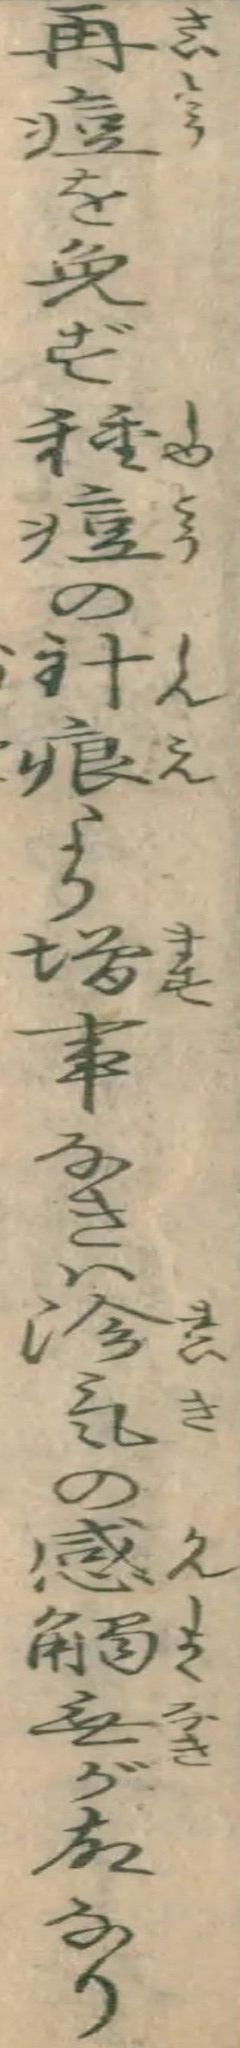再痘を免ず種痘の針痕より増事なき沴気の感觸無が故なり
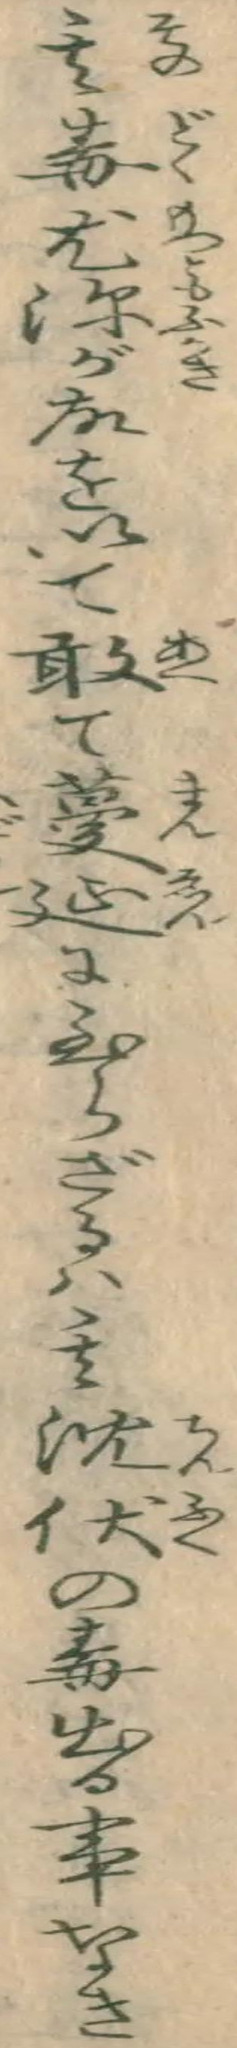其毒尤深が故を以て敢て蔓延に至らざるは其沈伏の毒出る事なき
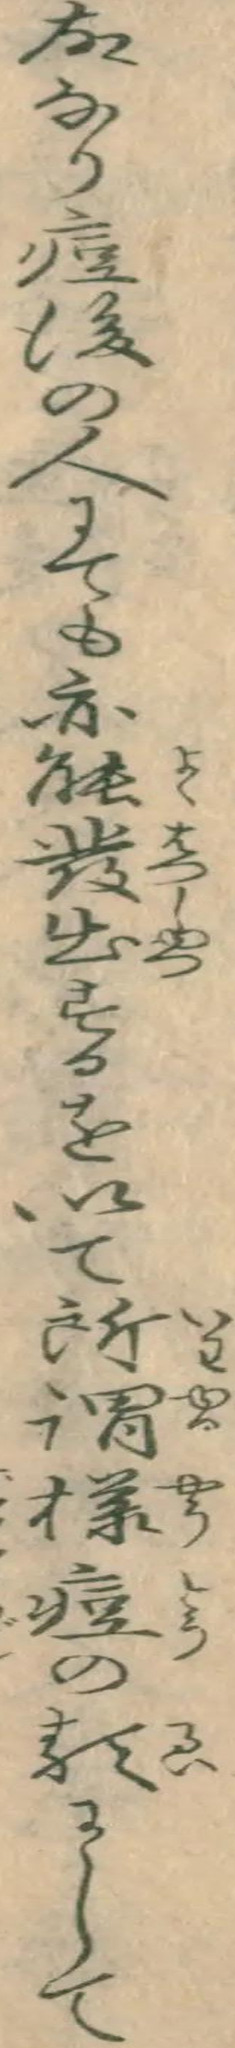故なり痘後の人にても亦能発出するを以て所謂様痘の類にして
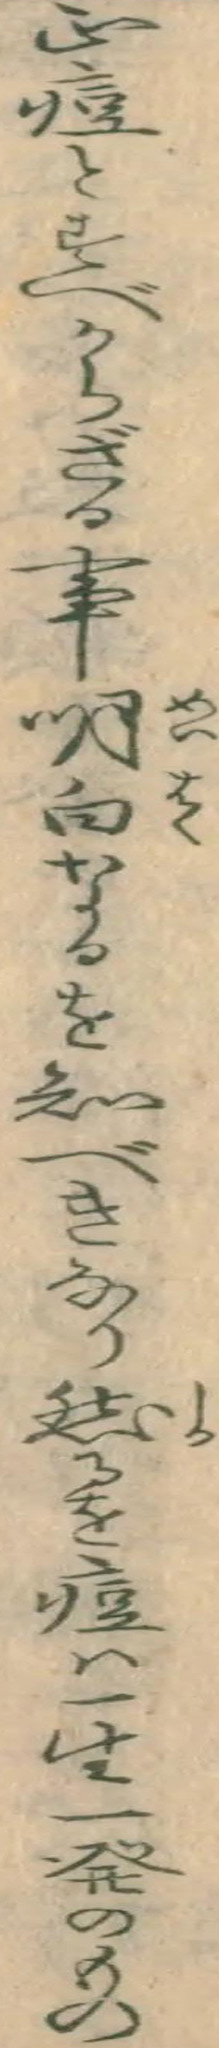正痘おつべからざる事明白なるを知べきなり然るを痘は一生一発のもの
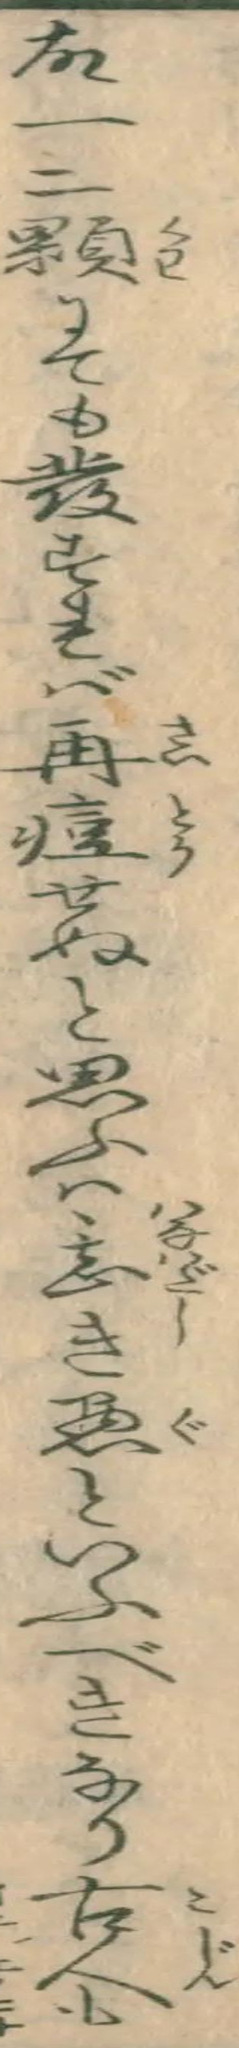故一二顆にても發すれば再痘せぬと思ふは甚き愚といふべきなり古人も
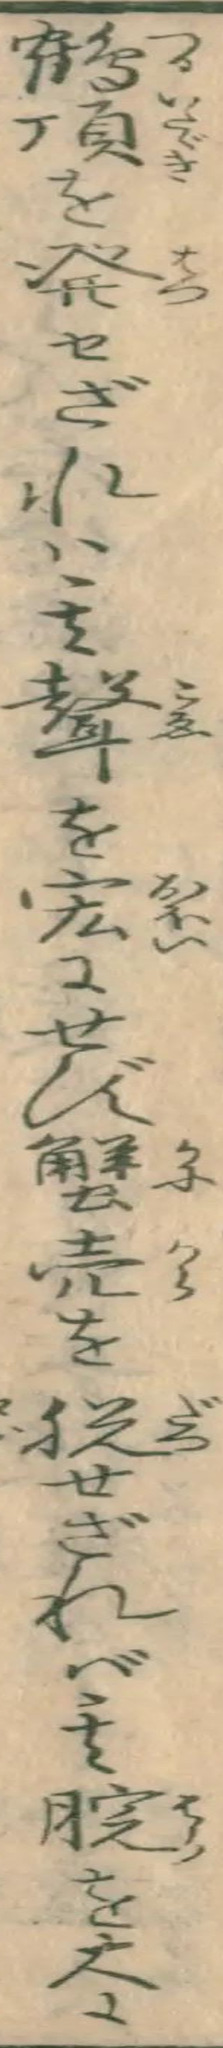鶴頂を発せざれは其聲を宏にせず蟹売を脱せざれば其脱脱大に
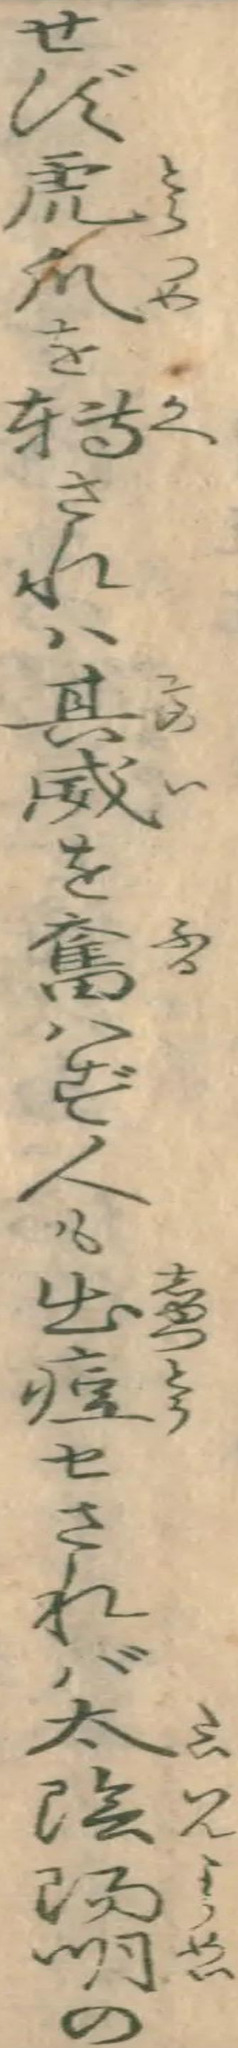せば虎爪を転されは其威を奮はず人も出痘せされば太陰陽明の
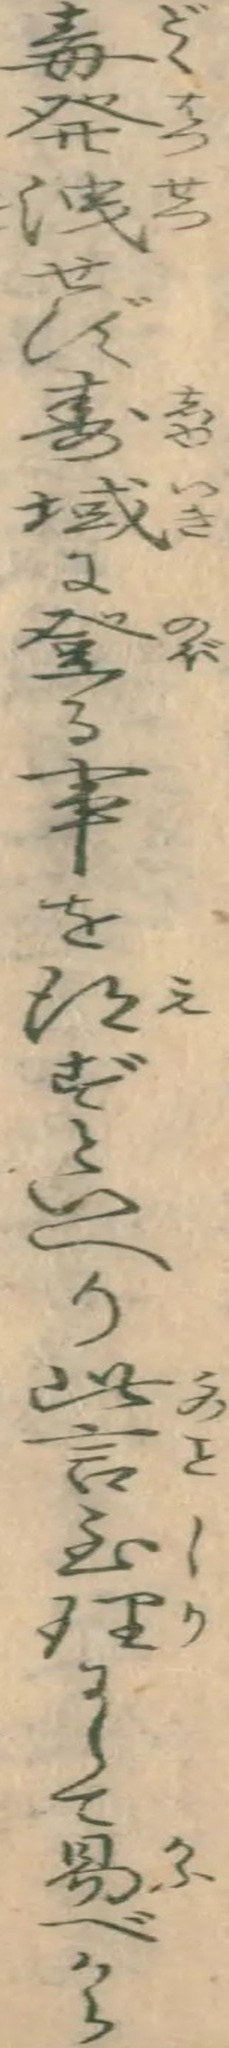毒発洩せず壽域に登る事を得ずといへり此言至理にして易べから
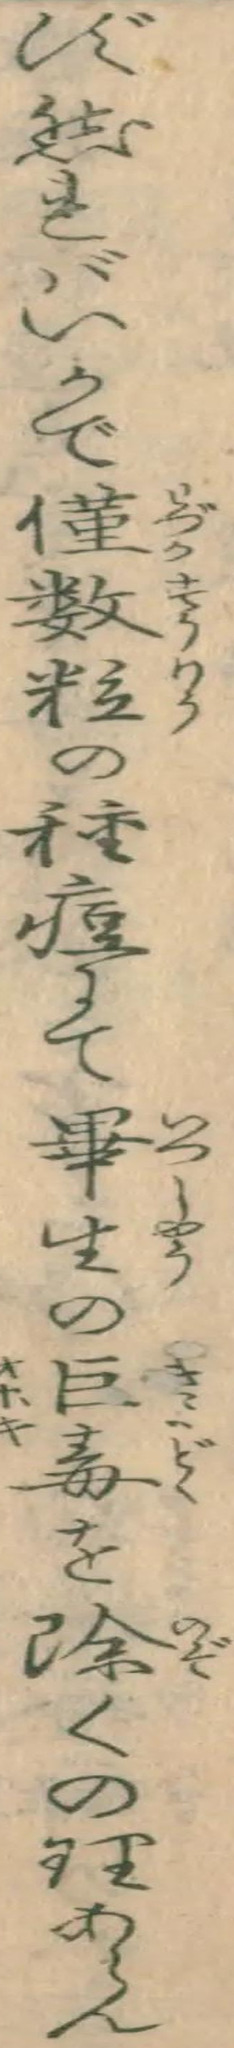ず然ればいかで僅数粒の種痘にて畢生の巨毒を除くの理あらん
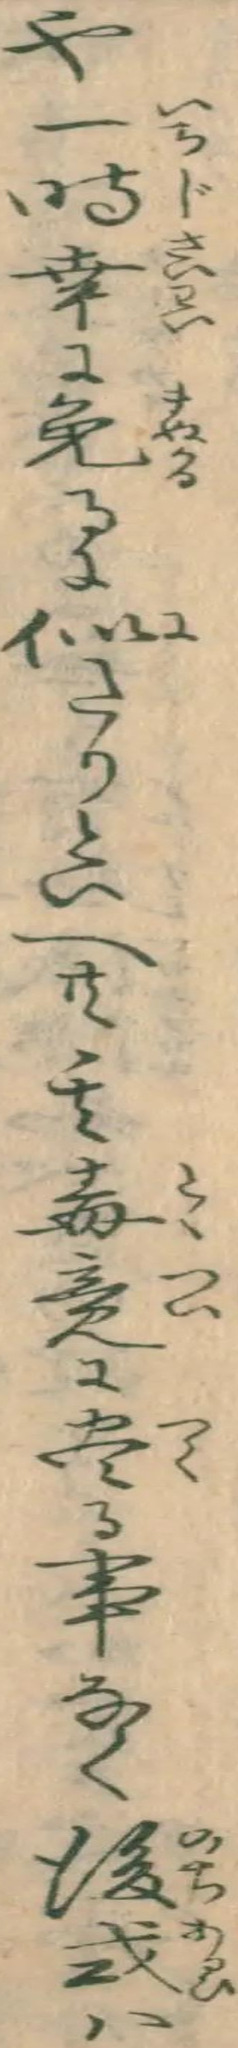や一時幸に免るに似たりといへ其毒竟に尽る事なく後或は
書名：牛痘辨非
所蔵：国立国会図書館 National Diet Library, JAPAN
